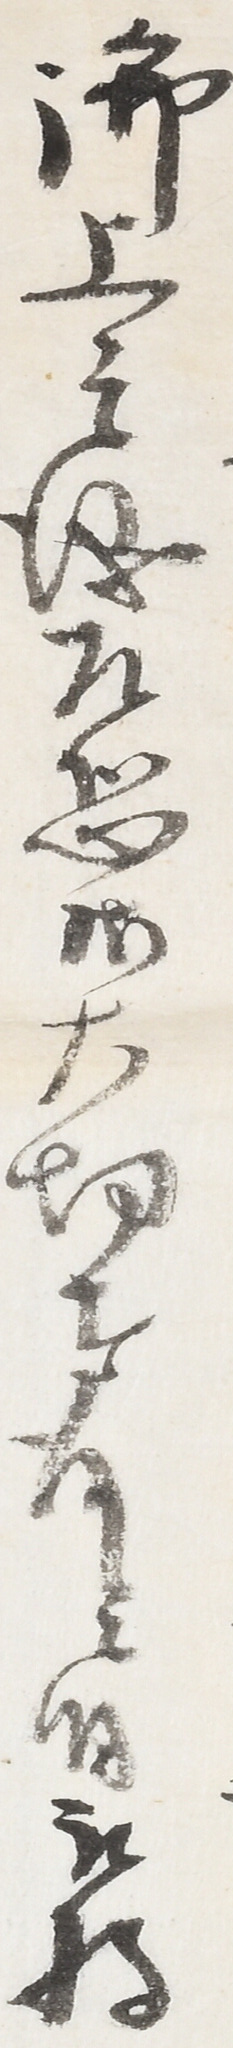御上之儀乍恐御大切奉存候ニ付被為
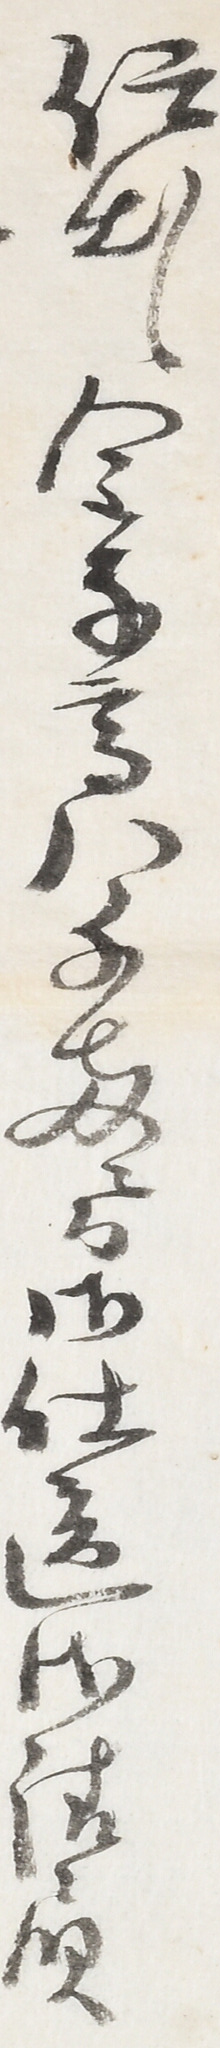仰出候金子高八千両ニ而御仕送御請負
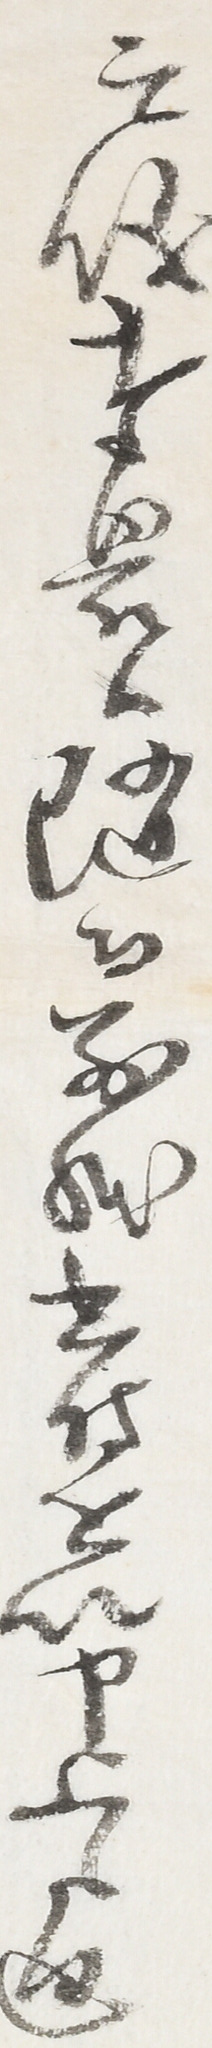之儀奉畏候随而別紙書付を以申上候通

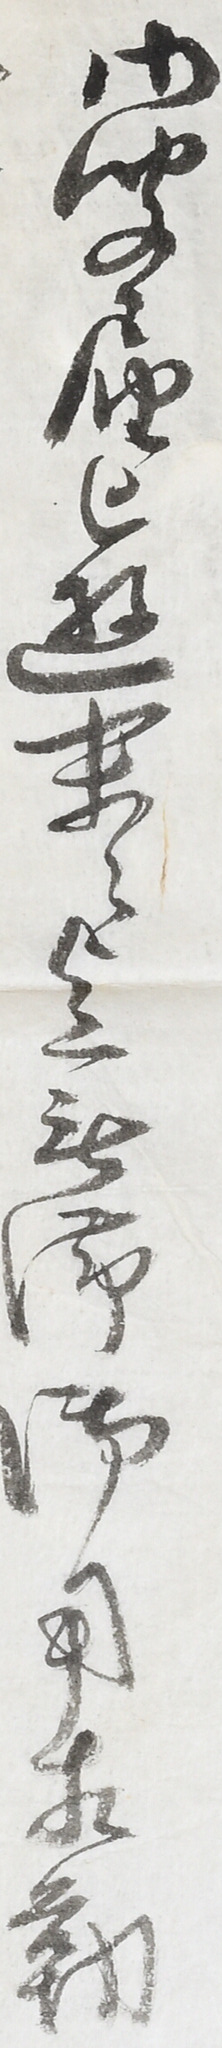御聞届被遊末々迄無滞御用相勤
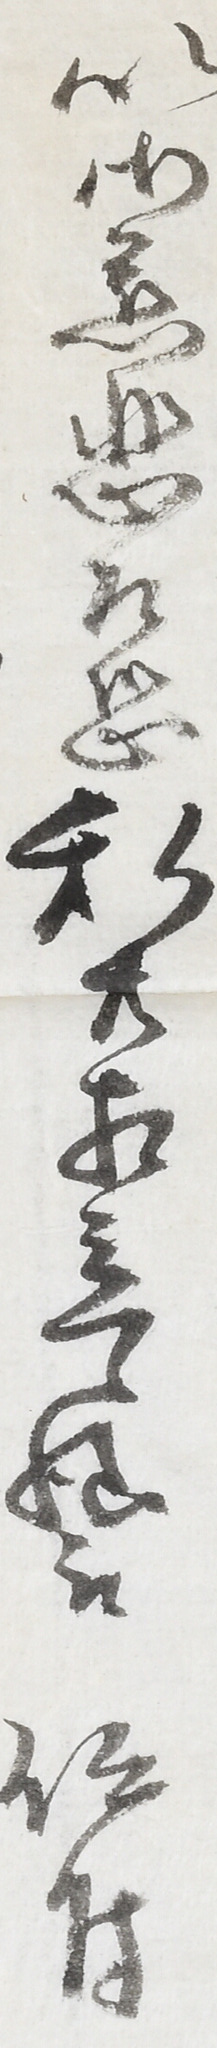以御慈悲乍恐私共相立候様被仰付
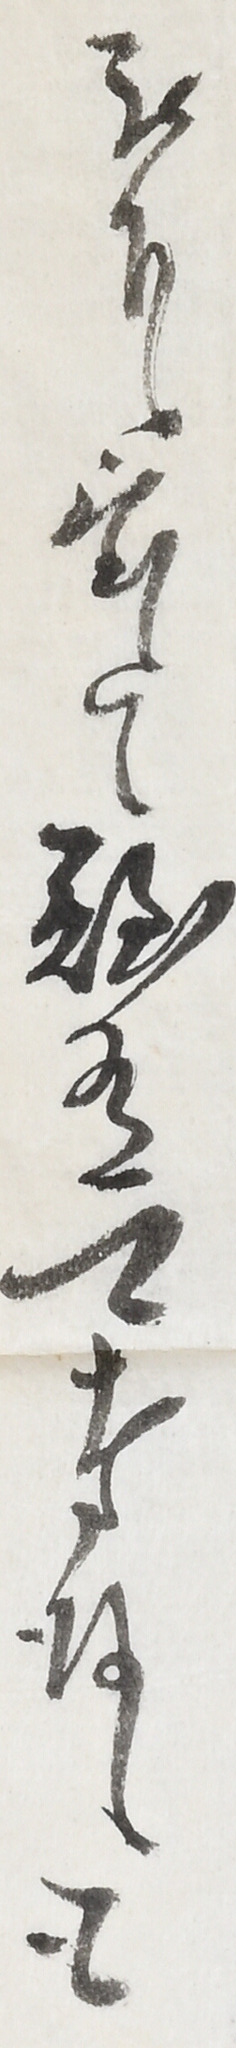被下置候ハゝ難有可奉存候以上
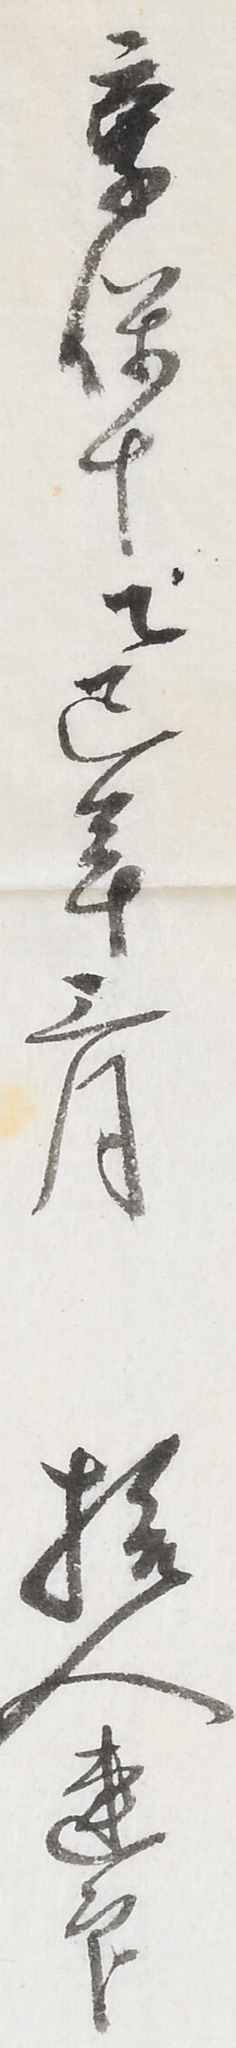享保十乙巳年三月拾人連印
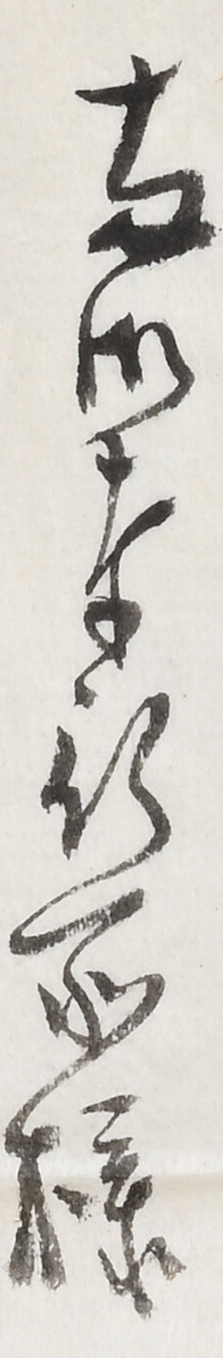両御奉行所様
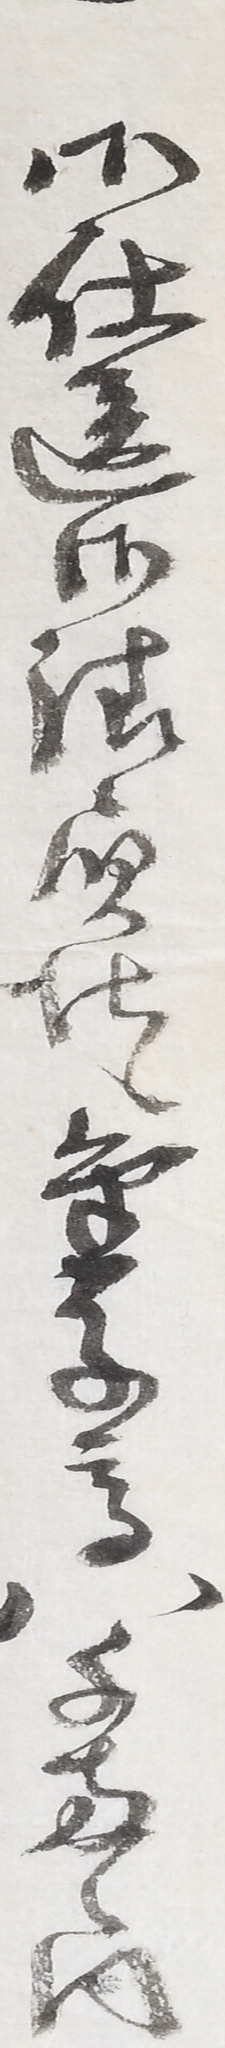一御仕送御請負仕候金子高八千両之内
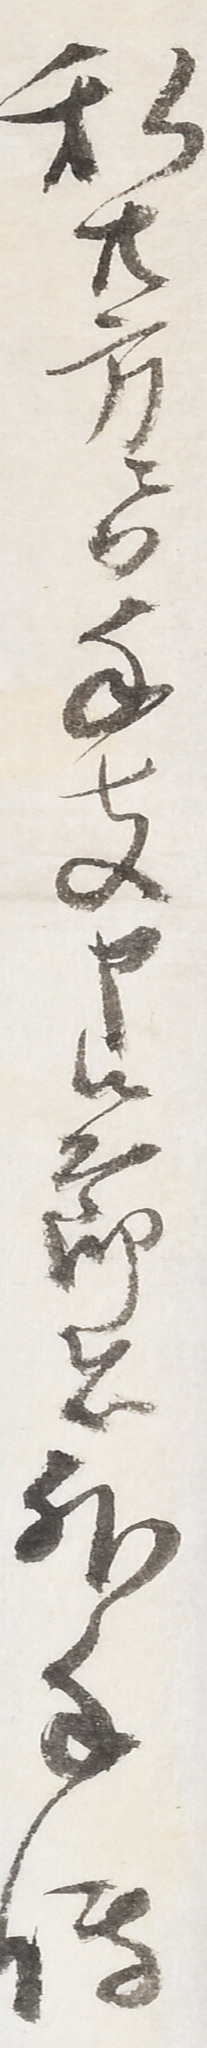私共方ニ而手支申候節者外手伝
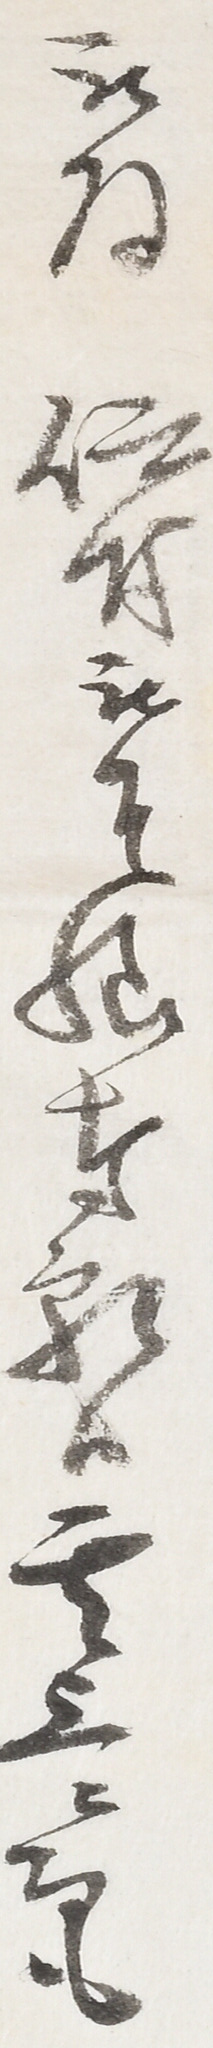被為仰付被下候様奉願候其上ニ而も
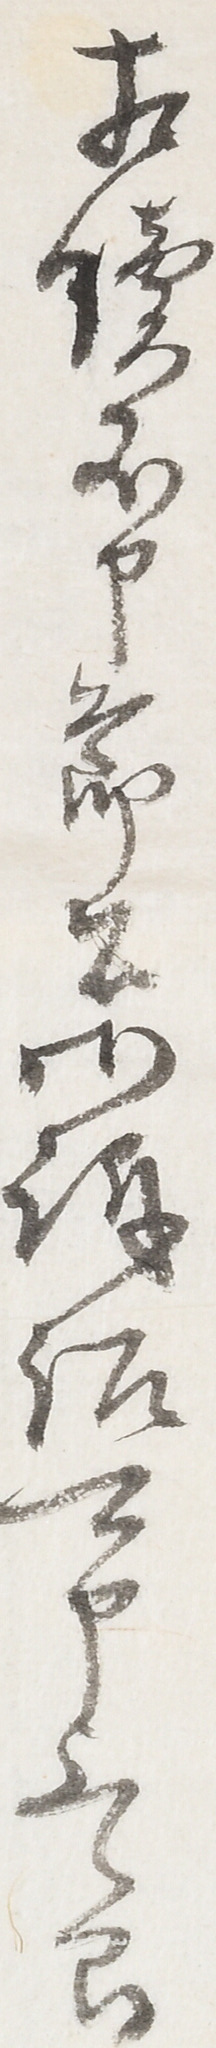相続不申節者御訴訟可申上候間
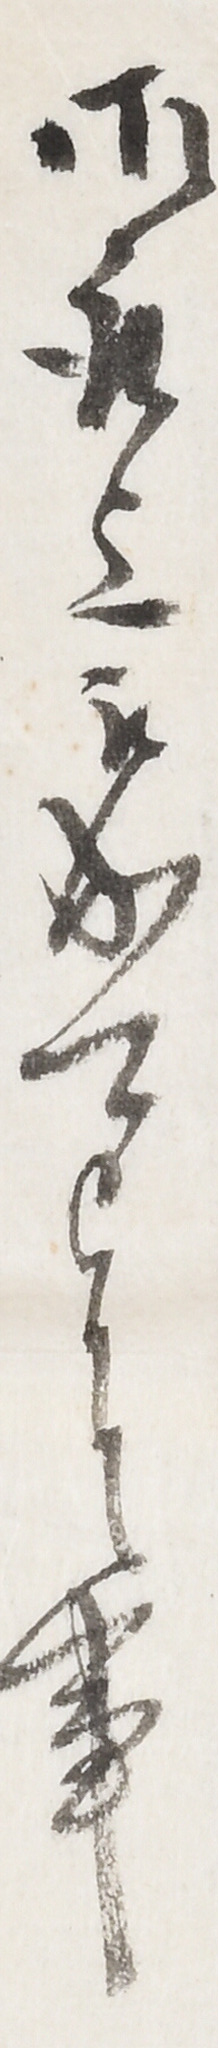御取上被成可被下事
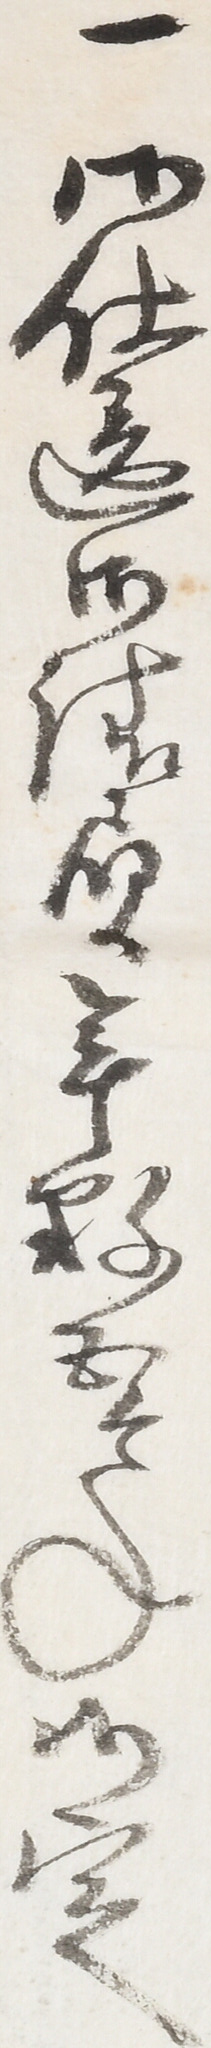一御仕送御請負年数五ケ年御定
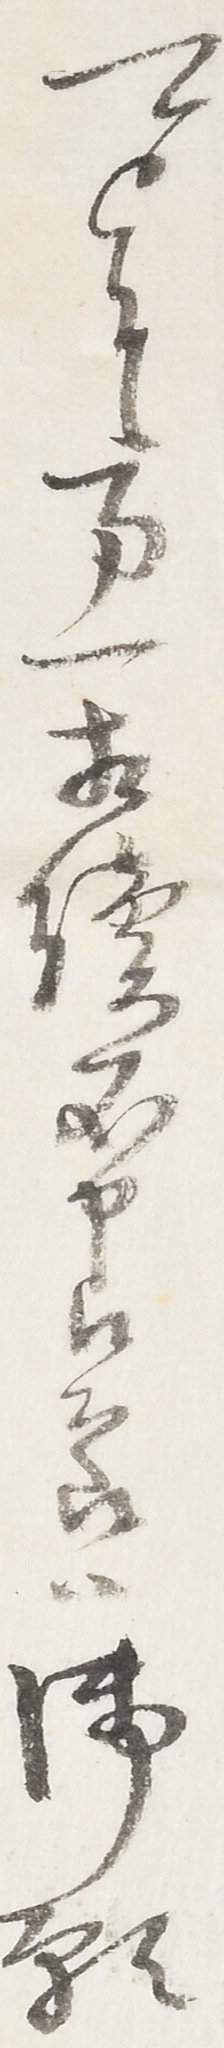可被下候万一相続不申候節ハ御願
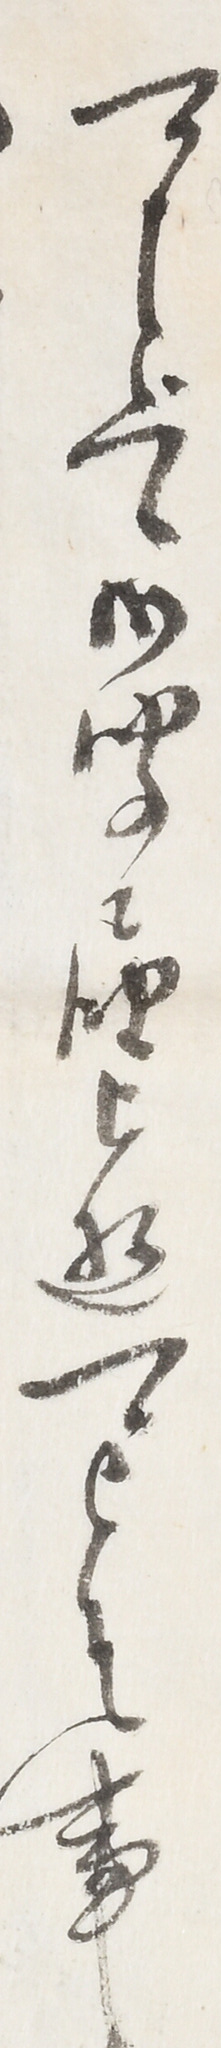可申上候御聞届被遊可被下事
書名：覚
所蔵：伊那市立高遠町図書館・合同会社AMANE
